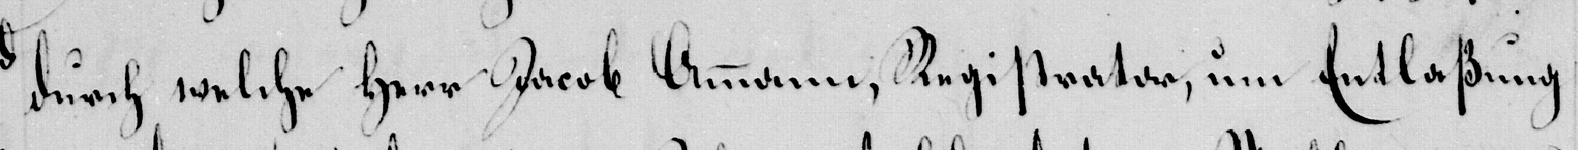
durch welche Herr Jacob Ammann, Registrator, um Entlaßung
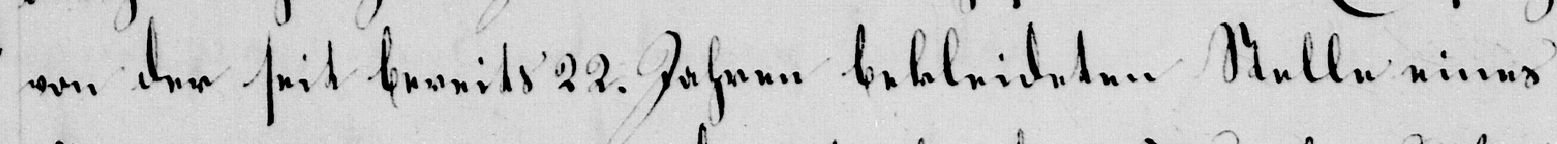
von der seit bereits 22. Jahren bekleideten Stelle eines
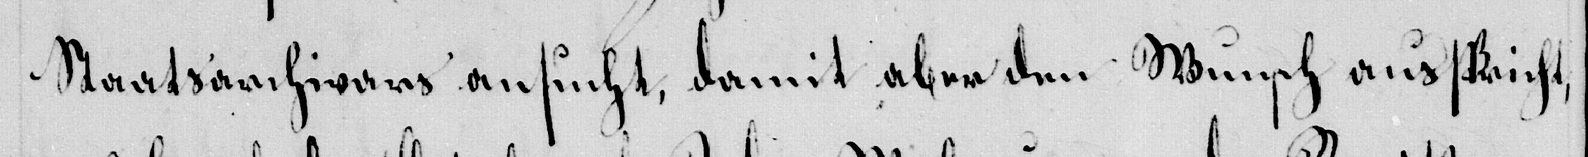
Staatsarchivars ansucht, damit aber den Wunsch ausspricht,
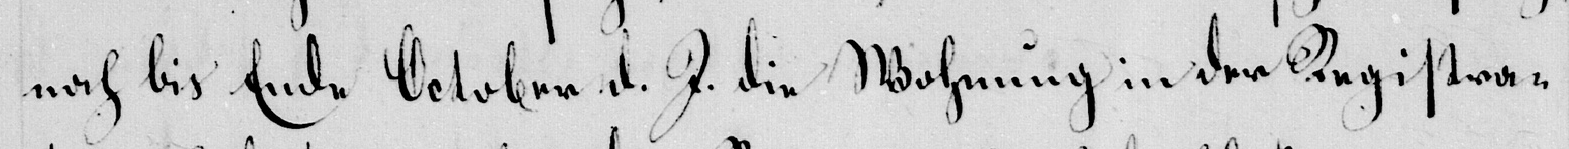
noch bis Ende October d. J. die Wohnung in der Registra¬
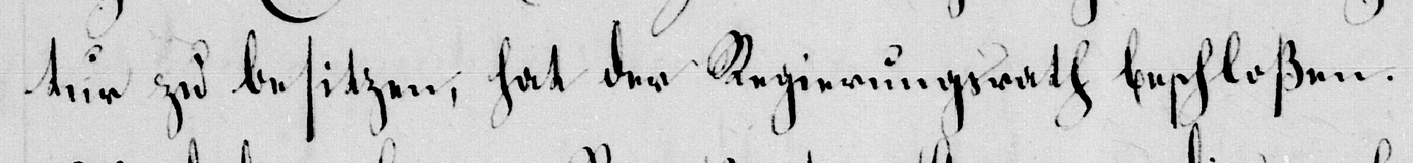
tur zu besitzen, hat der Regierungsrath beschloßen.
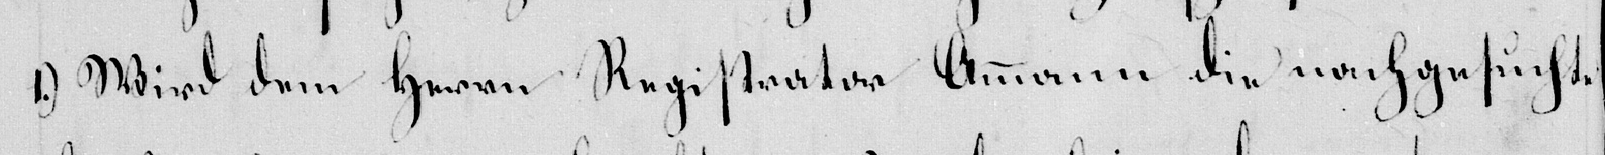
1.) Wird dem Herrn Registrator Ammann die nachgesuchte
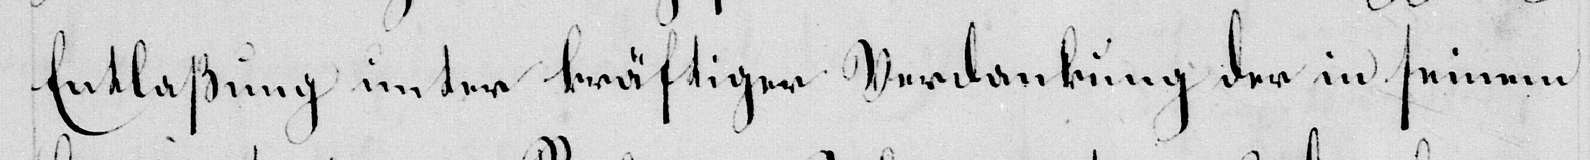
Entlaßung unter kräftiger Verdankung der in seinem
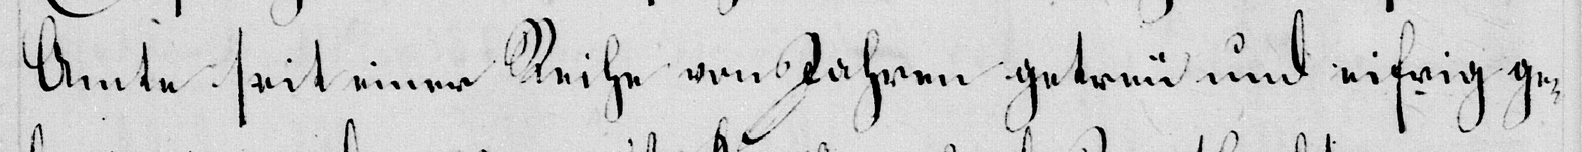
Amte seit einer Reihe von Jahren getreu und eifrig ge¬
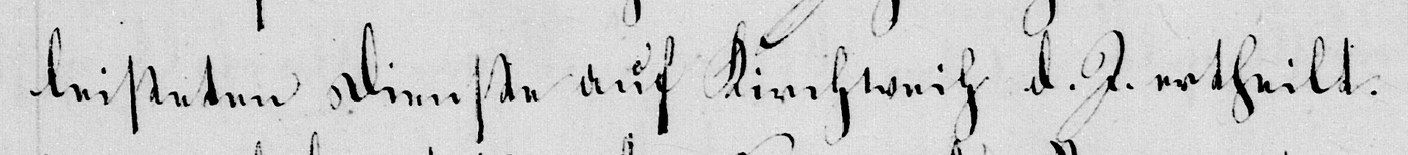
leisteten Dienste auf Kirchweih d. J. ertheilt.
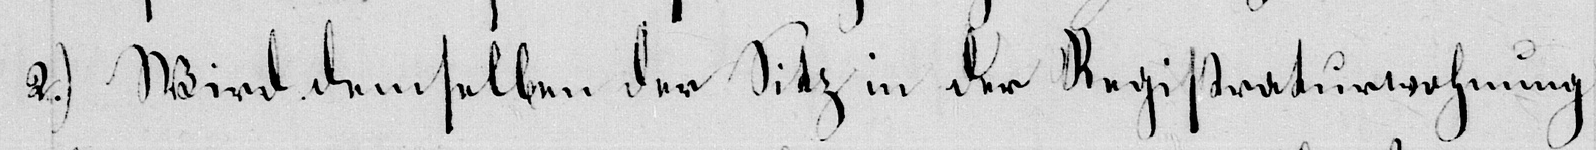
2.) Wird demselben der Sitz in der Registraturwohnung
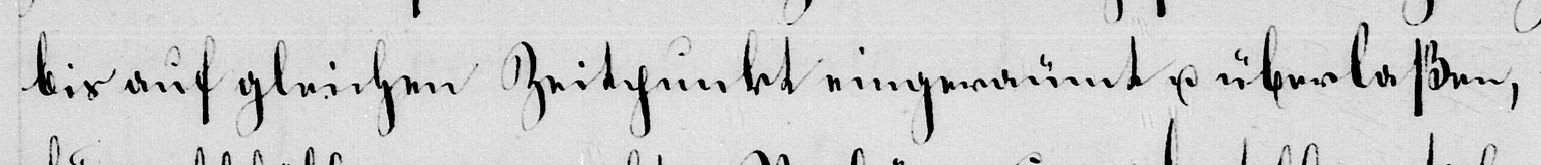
bis auf gleichen Zeitpunkt eingeräumt u. überlaßen,
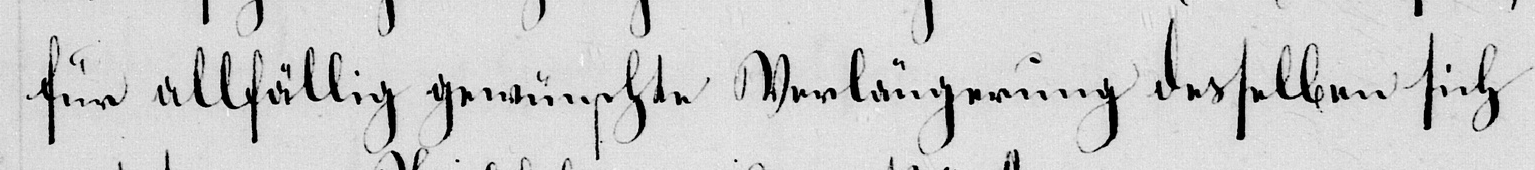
für allfällig gewünschte Verlängerung desselben sich
